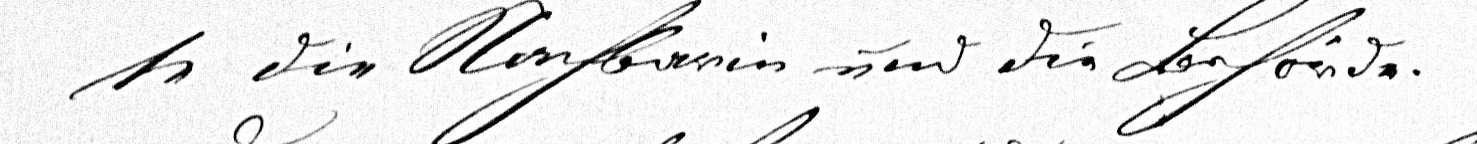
te die Nachbarin und die Behörde.
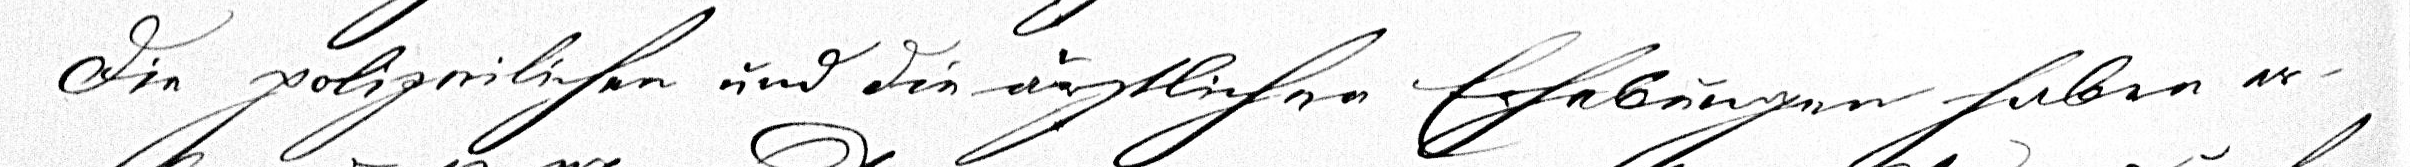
Die polizeilichen und die ärztlichen Erhebungen haben er¬
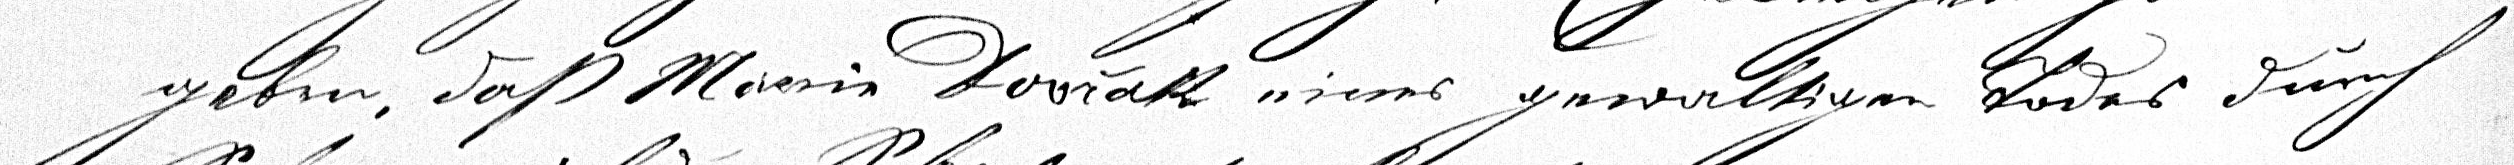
geben, daß Marie Dvořak eines gewaltigen Todes durch
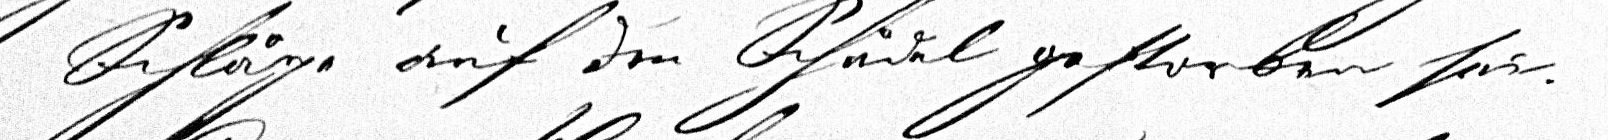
Schläge auf den Schädel gestorben sie.
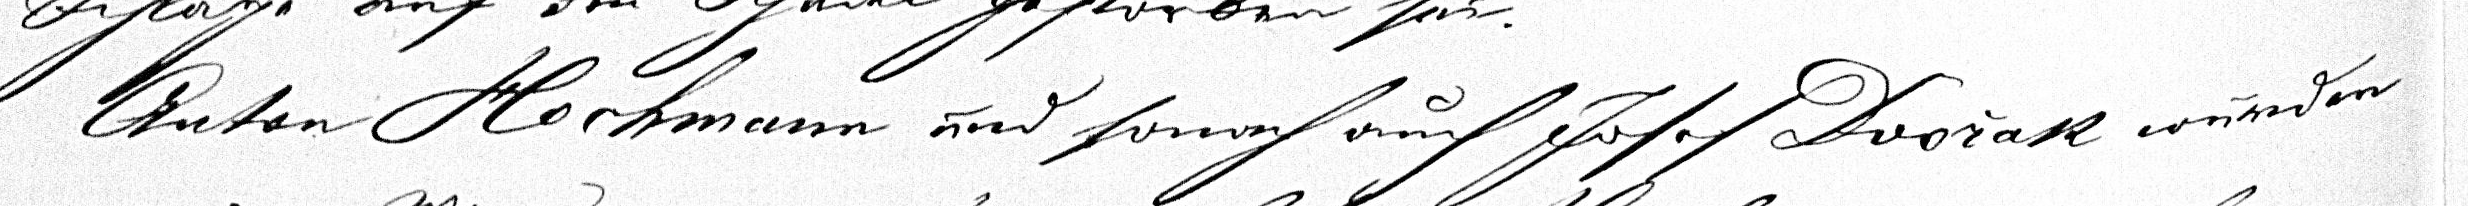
Anton Hochmann und sonach auf Josef Dvořak wurden
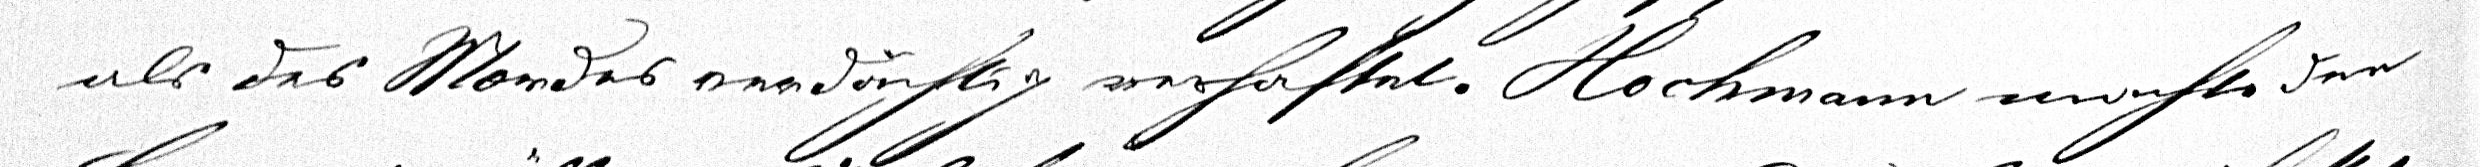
als des Mordes verdächtig verhaftet. Hochmann mochte den
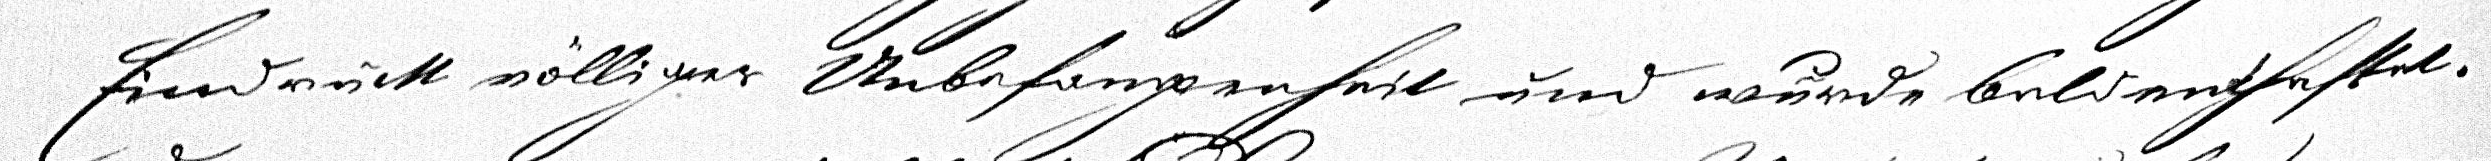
Eindruck völliger Unbefangenheit und wurde bald enthaltet.
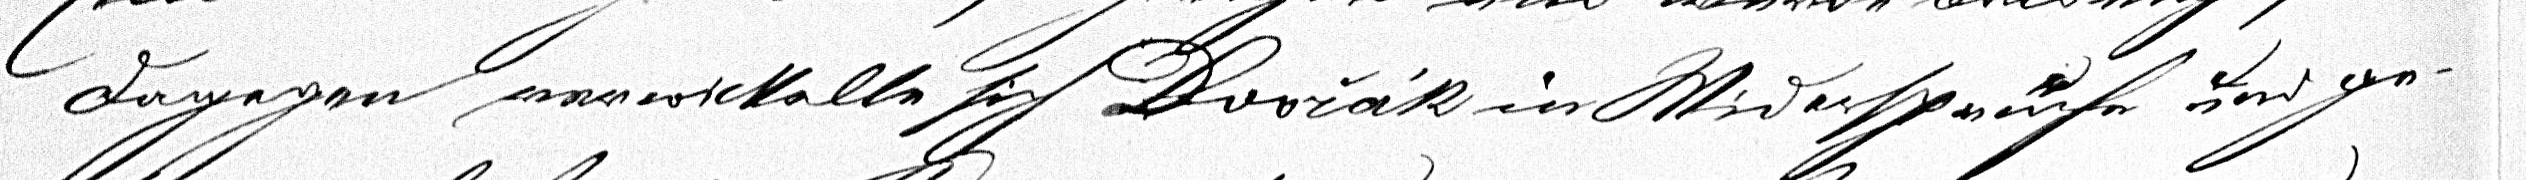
Dagegen verwickelte sich Dvořák in Widerspruche und ge¬
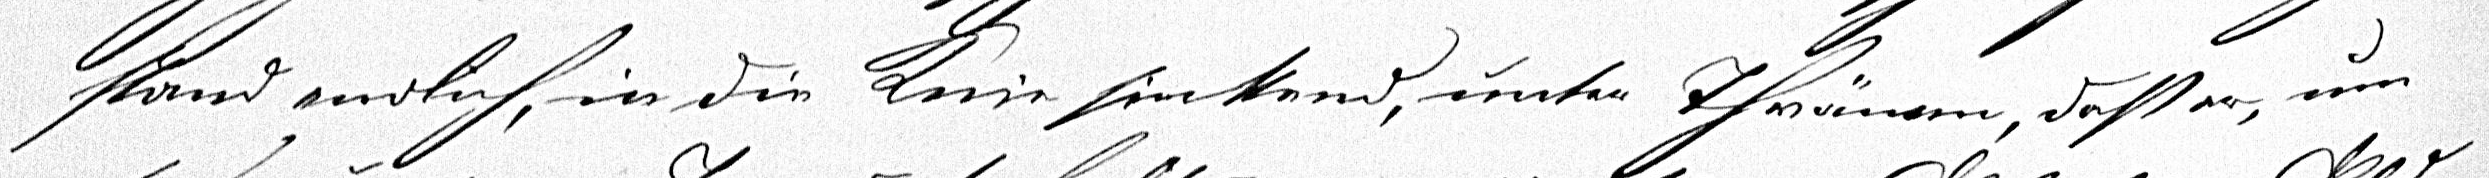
stand endlich, in die Kein sinkend, unter Thränem, daß er, um
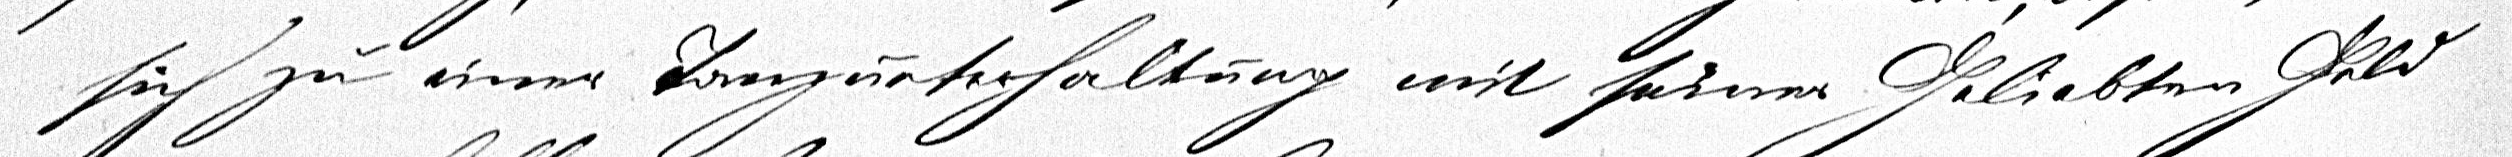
sich zu einer Tanzunterhaltung mit seiner Geliebten Geld
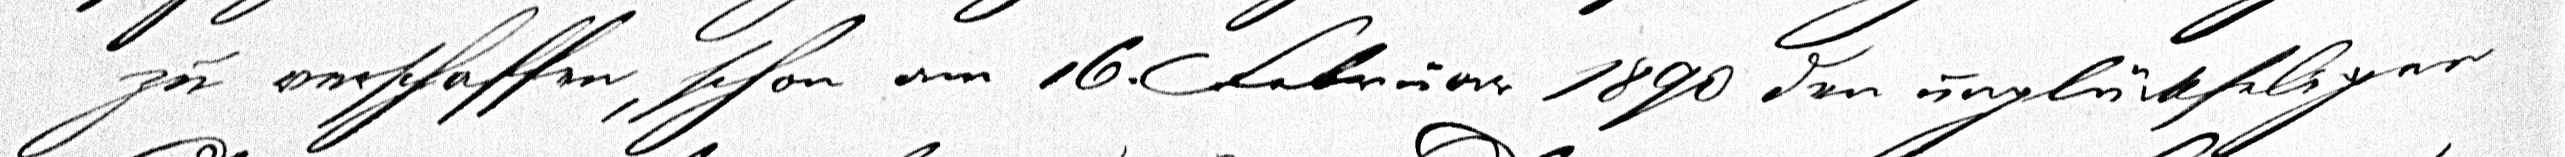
zu verschaffen, schon am 16. Februar 1890 den unglückseliger
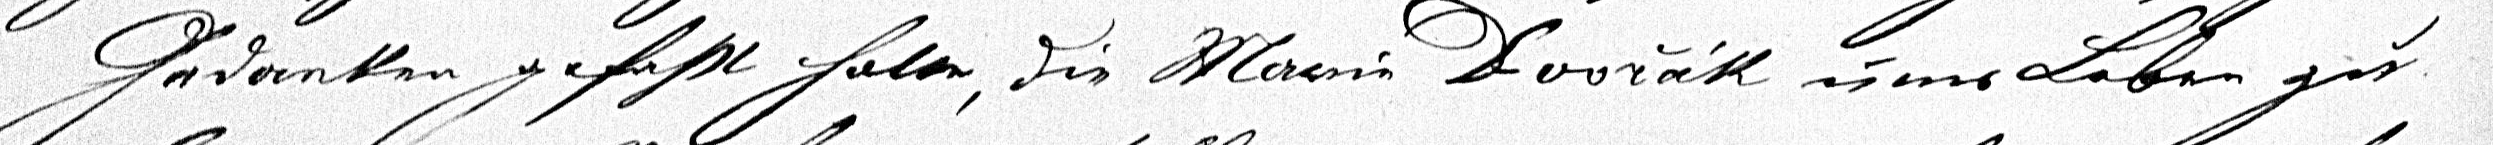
Gedanken gefaßt halte, die Marie Dvořák eines Leben zu
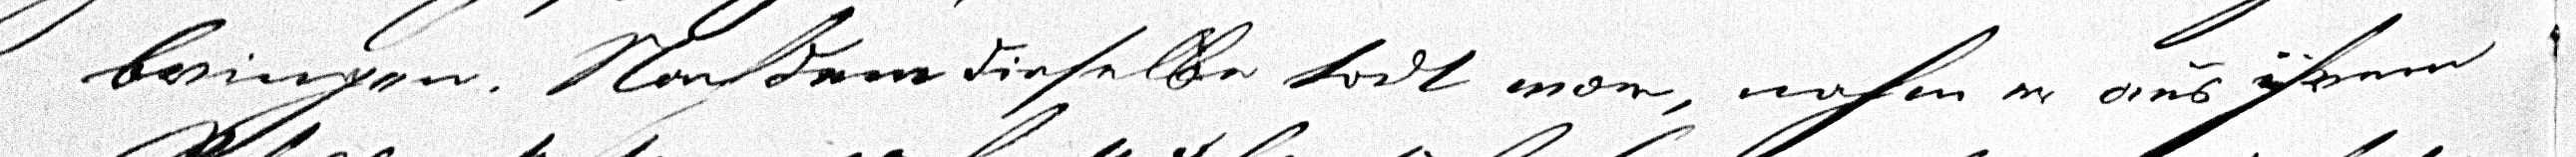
besingen. Nach dem dieselbe todt von, nahm er aus ihrem
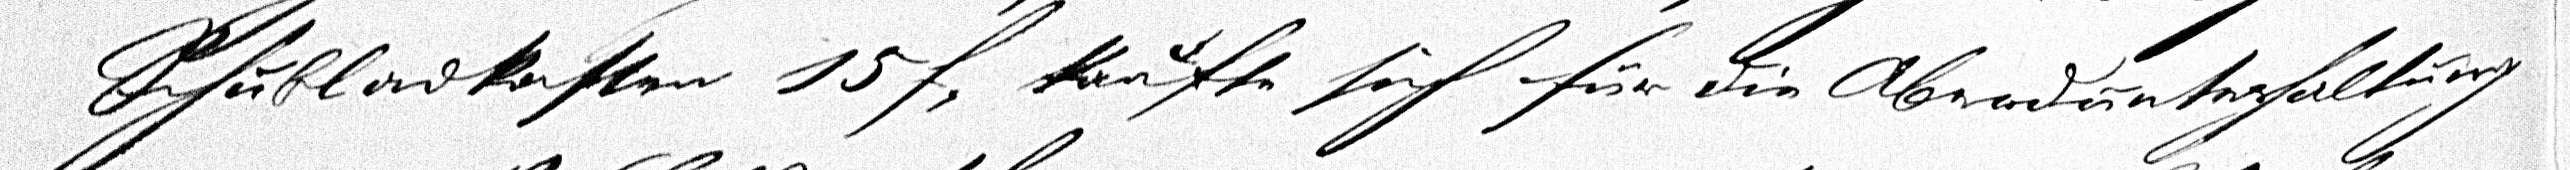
Schubladkasten 15 f, kaufte sich für die Abendunterhaltung
